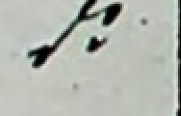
do
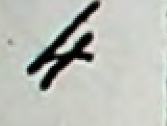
4
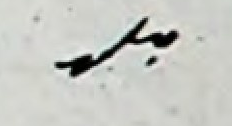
do
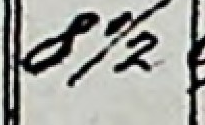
8 1/2
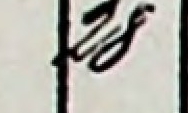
28
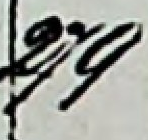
279
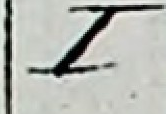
I
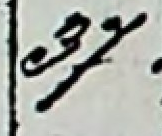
37
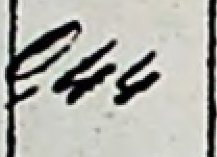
0,44
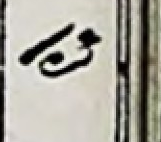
13
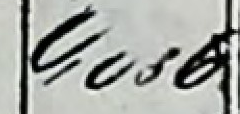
0,086
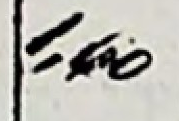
1,40
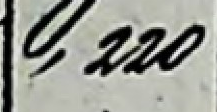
0,220
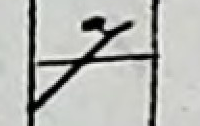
7
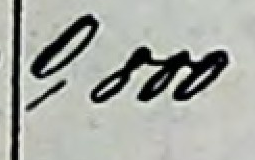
0,800
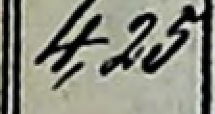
4,25
